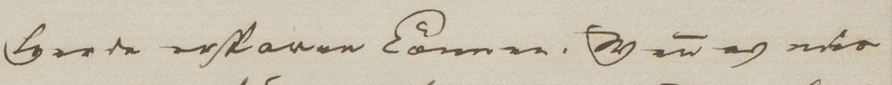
werde ersparen können. Wenn es mir
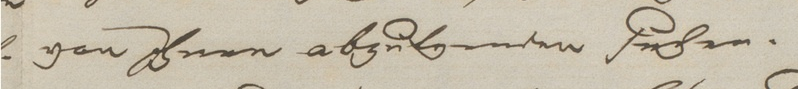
von Ihnen abzuwenden suchen.
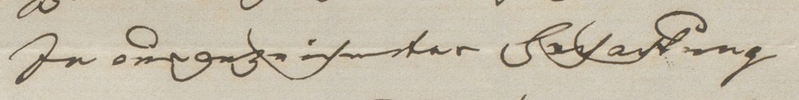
In ausgezeichneter Hochachtung
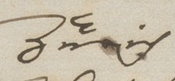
Zürich
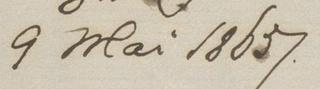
9 Mai 1865.
